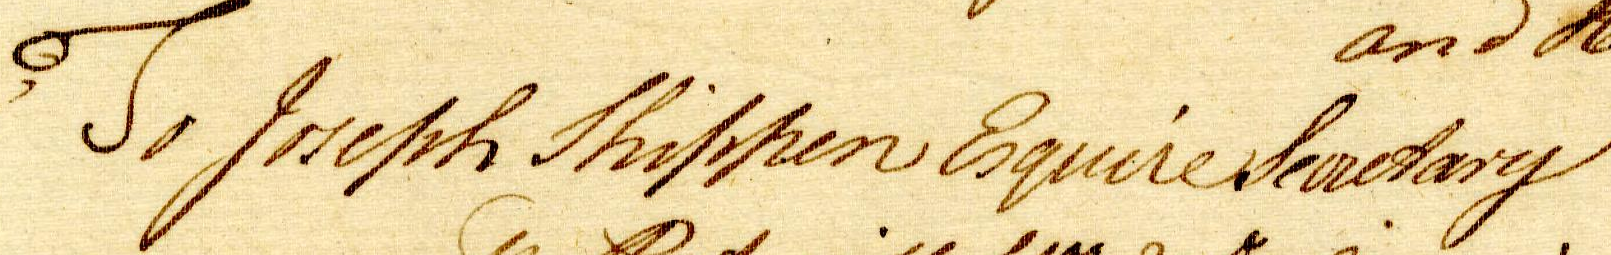To Joseph Shippen Esquire Secretary
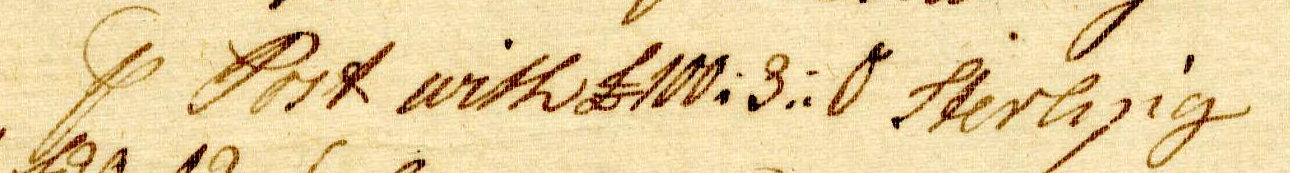per Post with & £100..3..0 Sterling
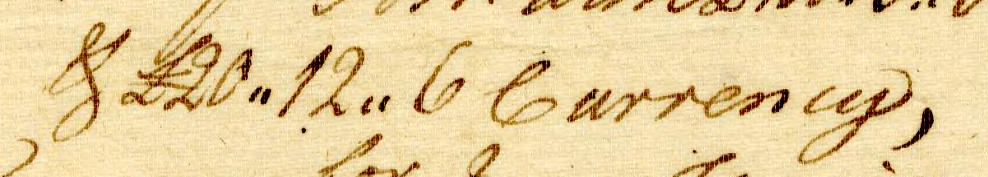& £20..12..6 Currency,
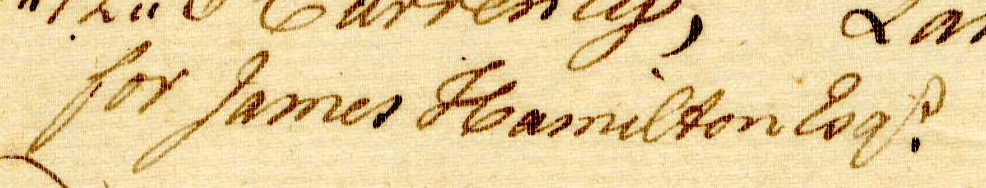for James Hamilton Esq^r.
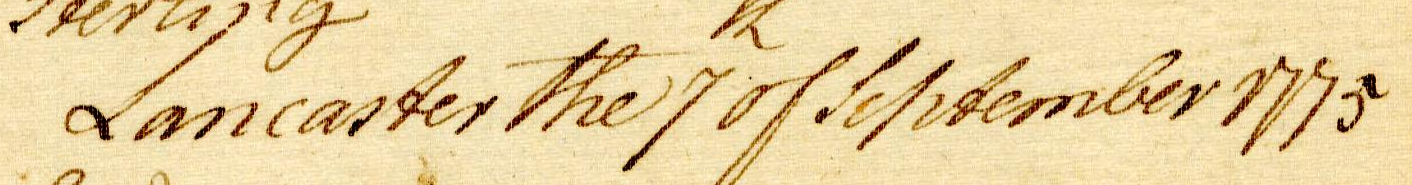Lancaster the 7^th of September 1775
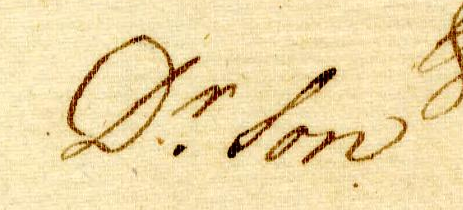D^r. Son
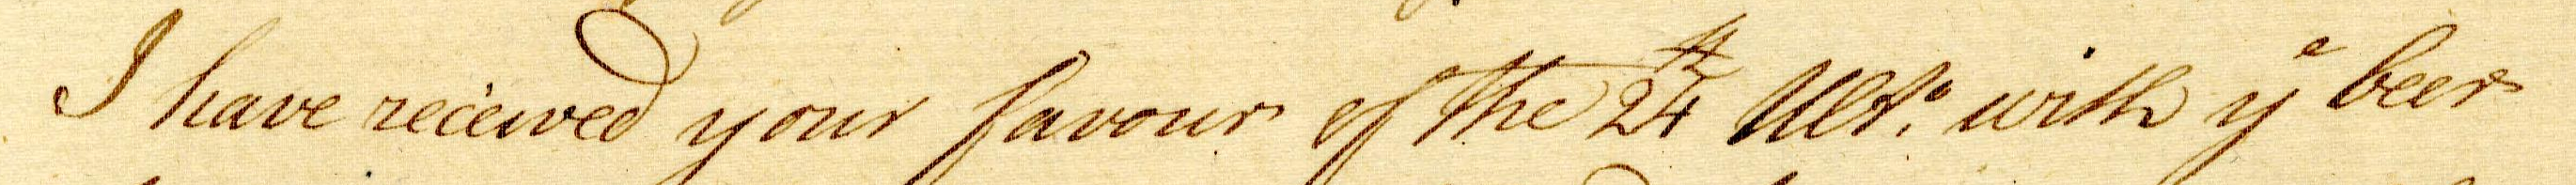I have received your favour of the 24^th Ult^o. with y^e beer
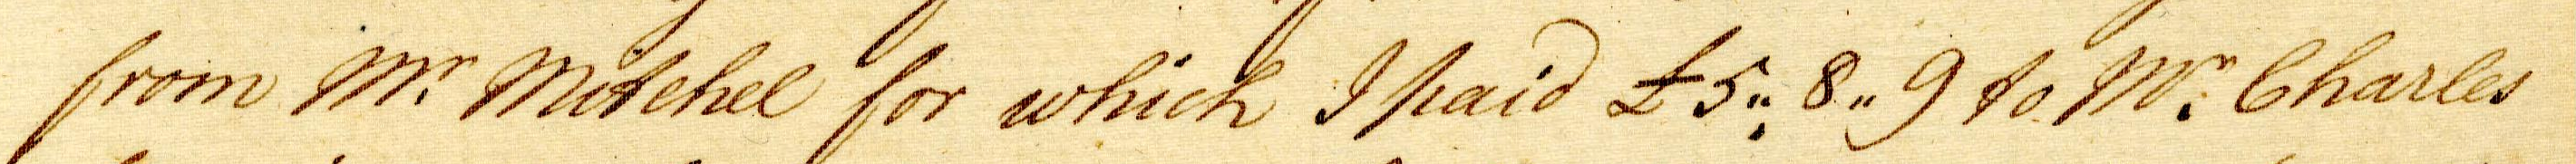from M^r. Mitchel for which I paid £5..8..9 to M^r. Charles
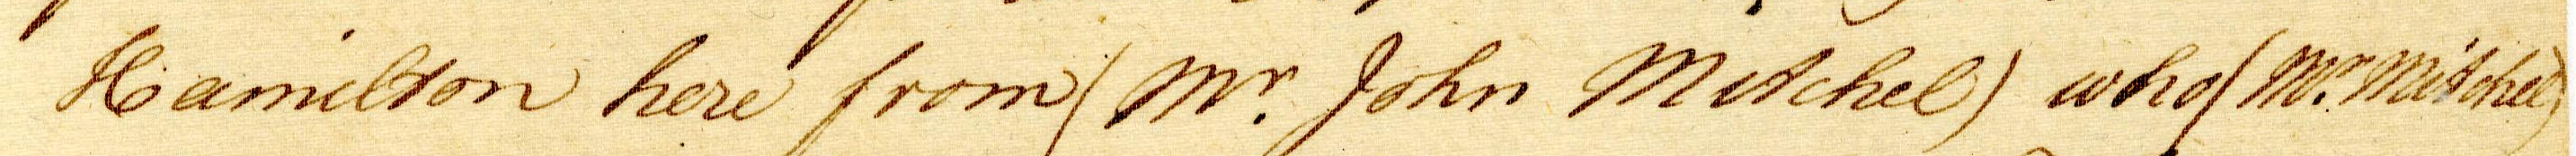Hamilton here from (M^r. John Mitchel) who (M^r. Mitchel)
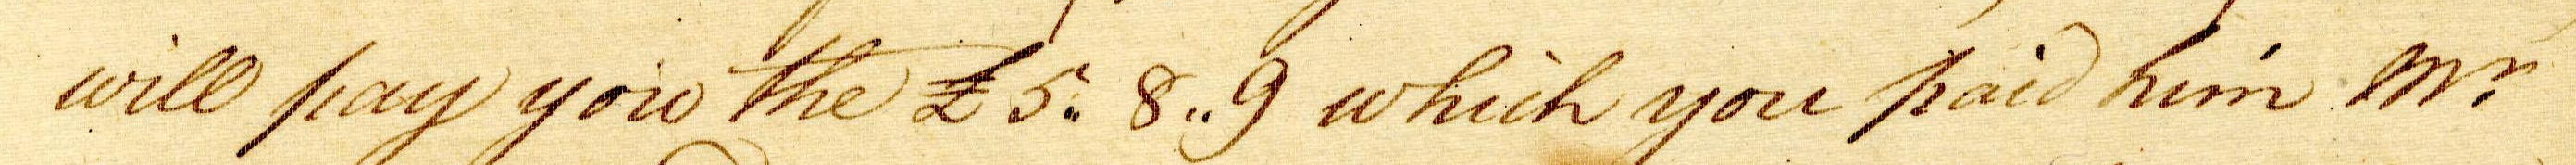will pay you the £5..8..9 which you paid him M^r.
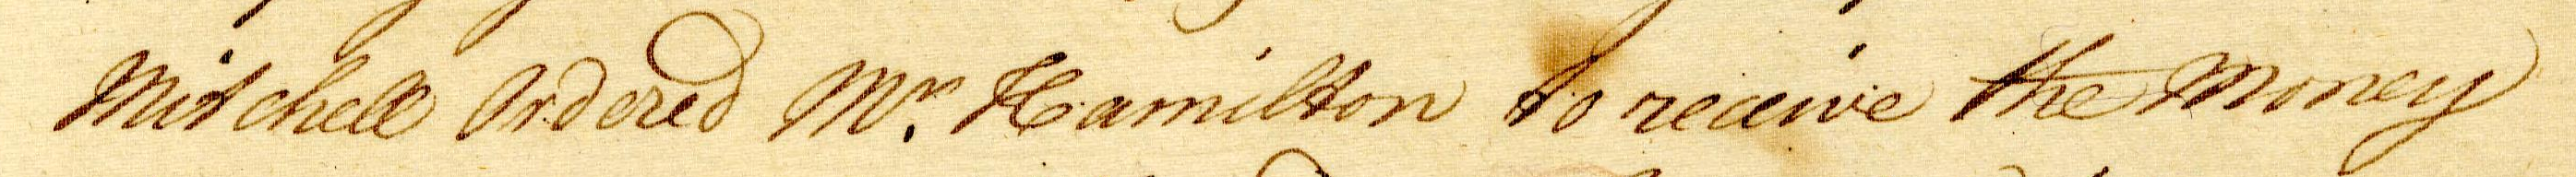Mitchell Ordered M^r. Hamilton to receive the Money
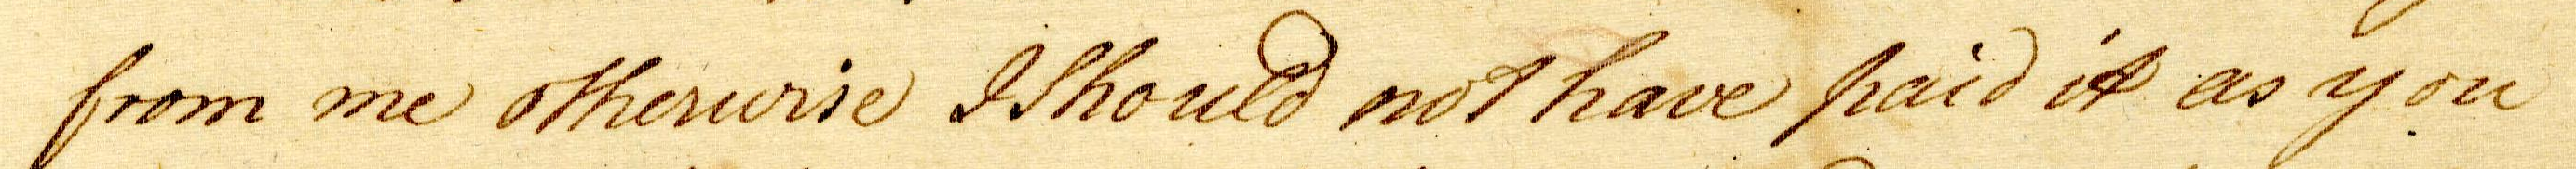from me otherwise I should not have paid it as you
